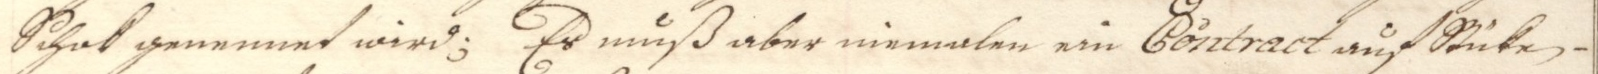Schok genennet wird. Es muß aber niemalen ein Contract auf Stüke -
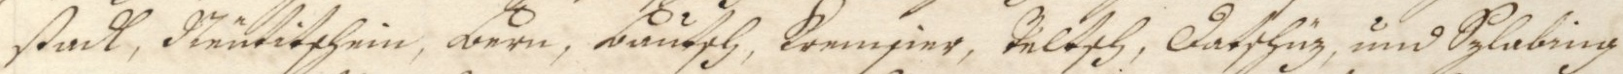stadl, Neütitschein, Bern, Bautsch, Kremsier, Teltsch, Datschüz, und Szlabing
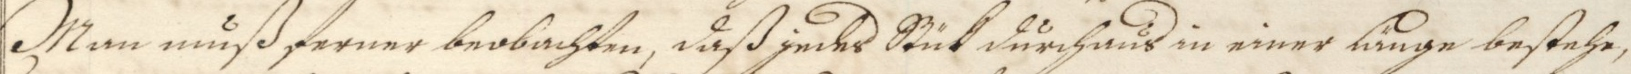Man muß ferner beobachten, daß jedes Stük durchaus in einer Länge bestehe,
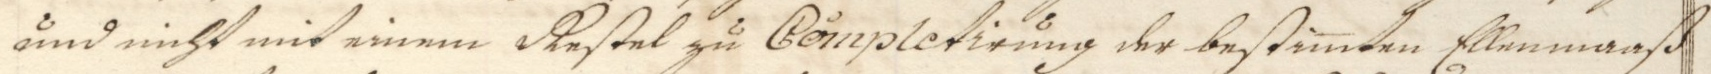und nicht mit einem Restel zu Completirung der bestimmten Ellenmaaß
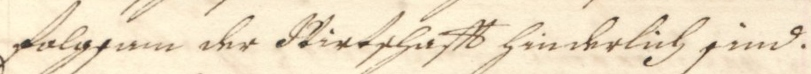folgsam der Wirtschafft hinderlich sind.
